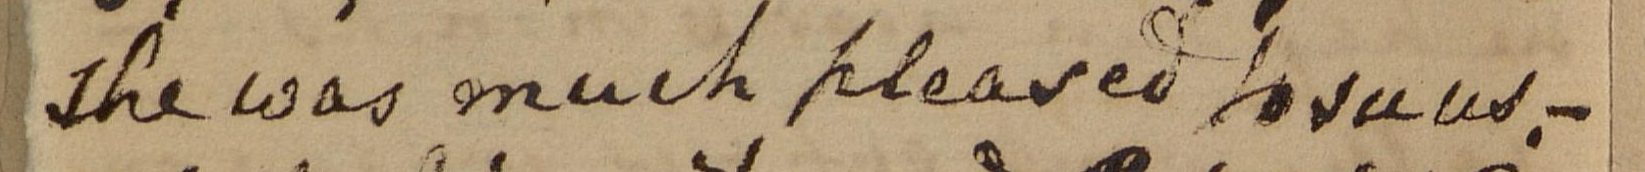she was much pleased to see us-
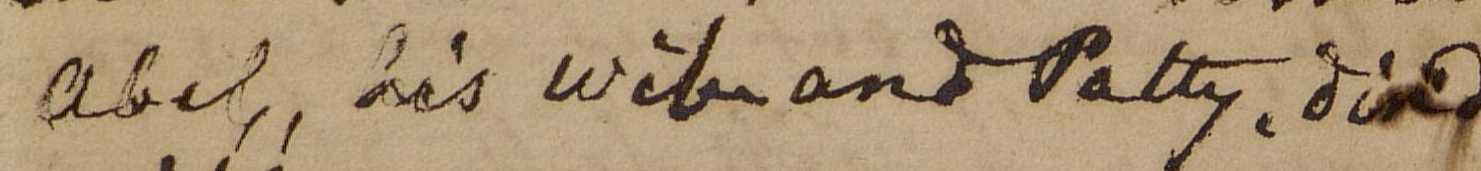Abel, his wife and Patty, din'd
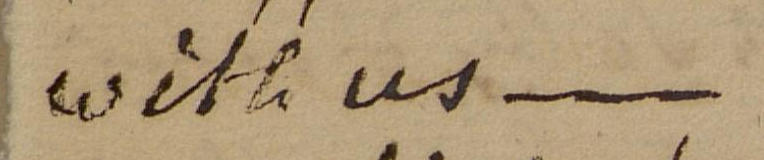with us-
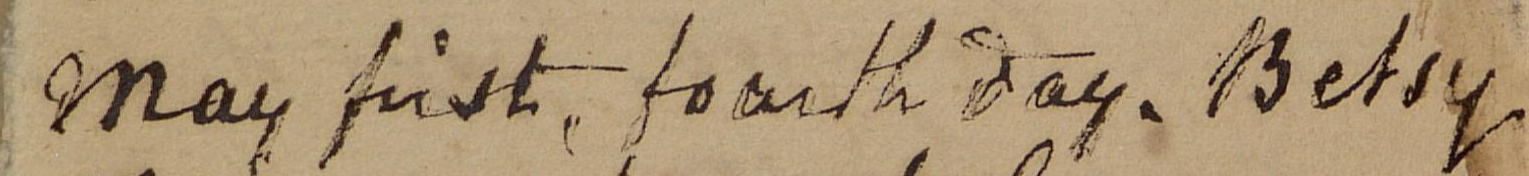May first, fourth day. Betsy
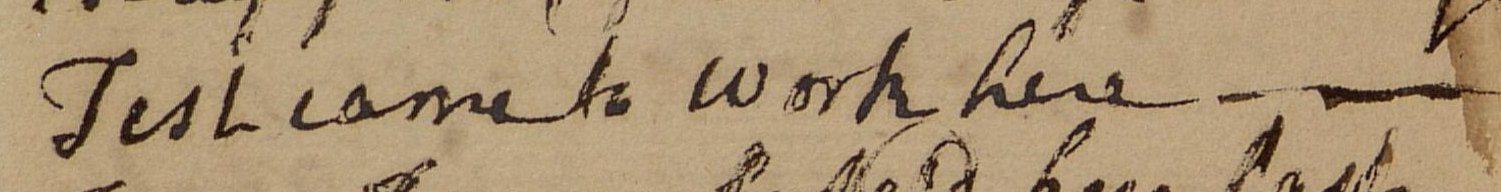Test came to work here-
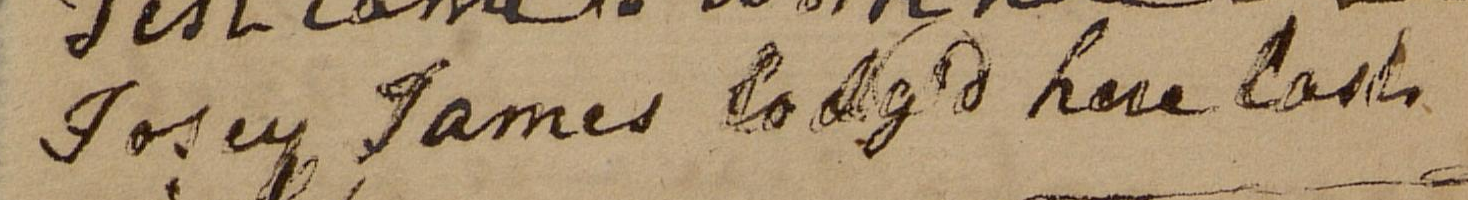Josey James lodg'd here last
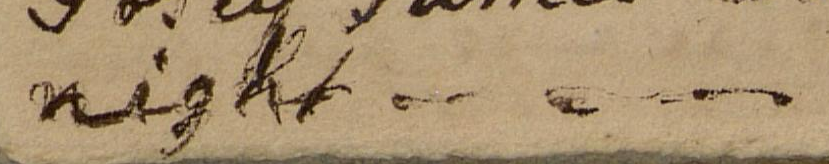night---
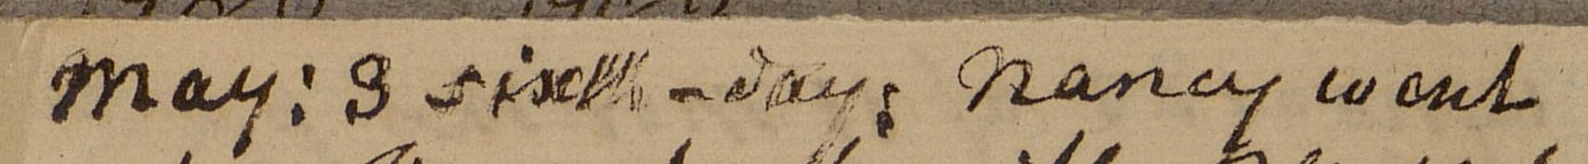May: 3 sixth- day: Nancy went
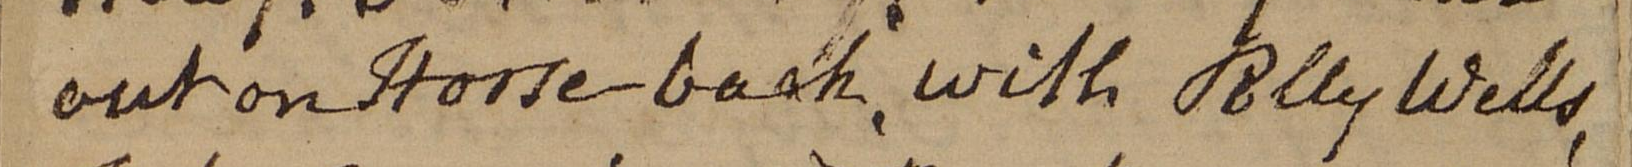out on Horse back, with Polly Wells
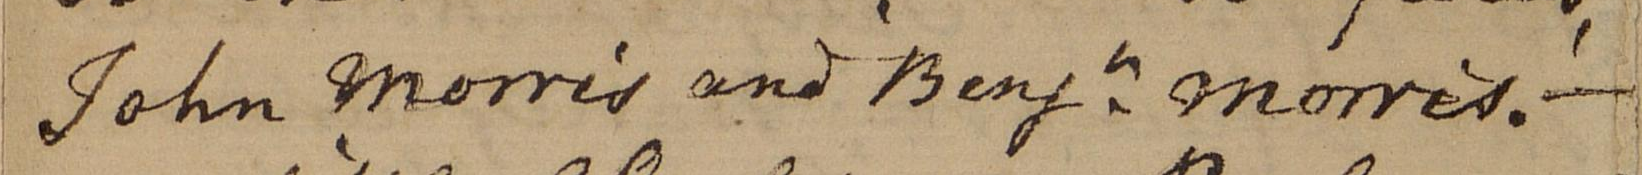John Morris and Benj^n Morris.-
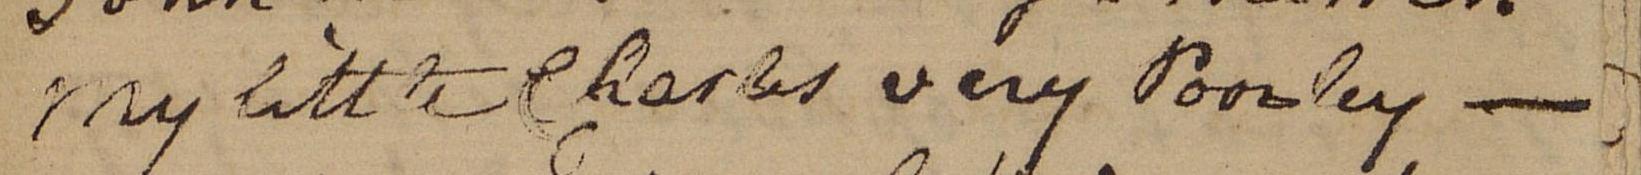my little Charles very Poorly-
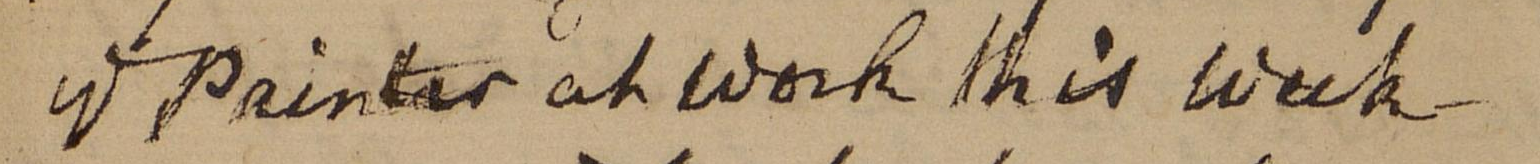y^e Painter at work this week-
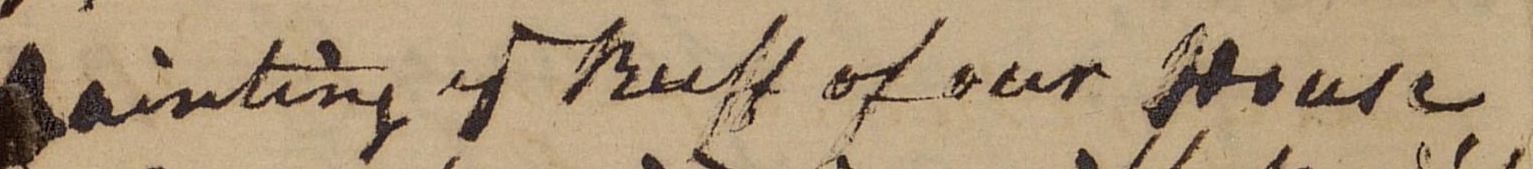painting y^e Ruff of our House
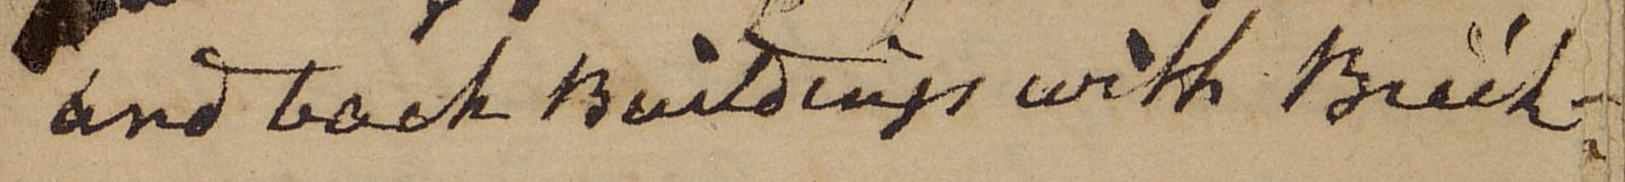and back Buildings with Brick-
